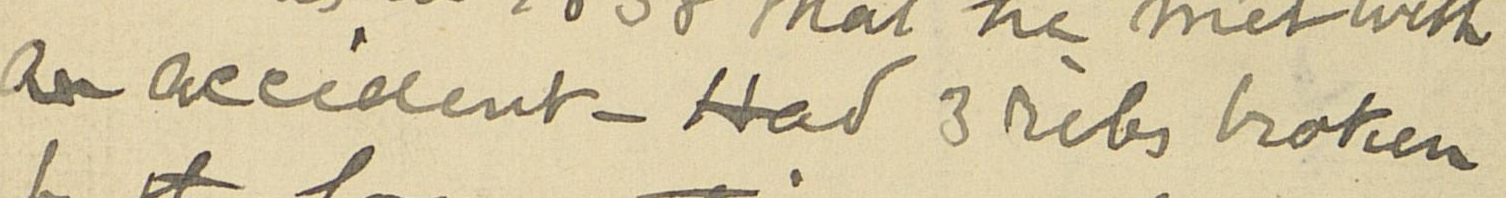an accident. Had 3 ribs broken
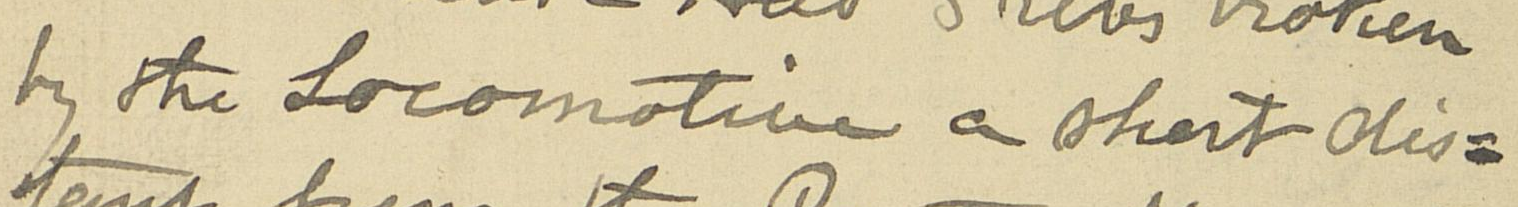by the Locomotive a short dis-
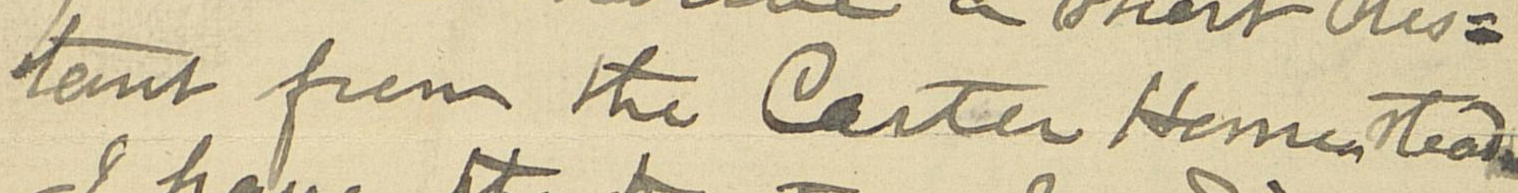-tant from the Carter Homestead
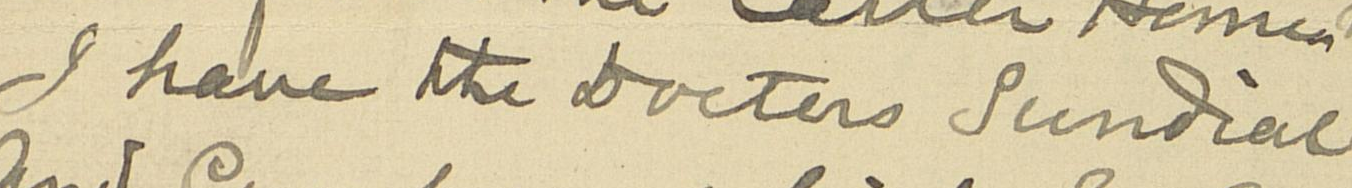I have the Docters Sundial.
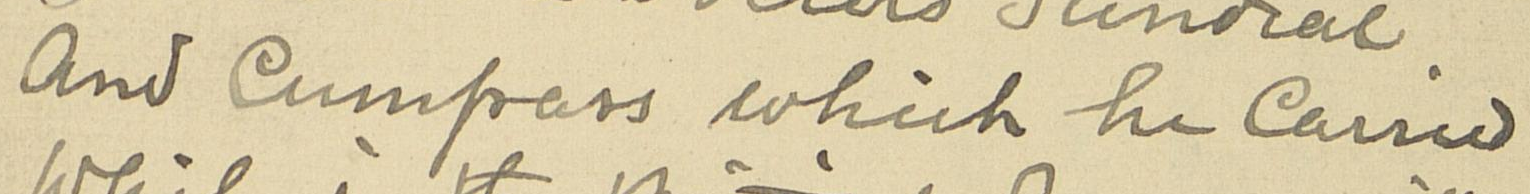And Cumpars which he Carried
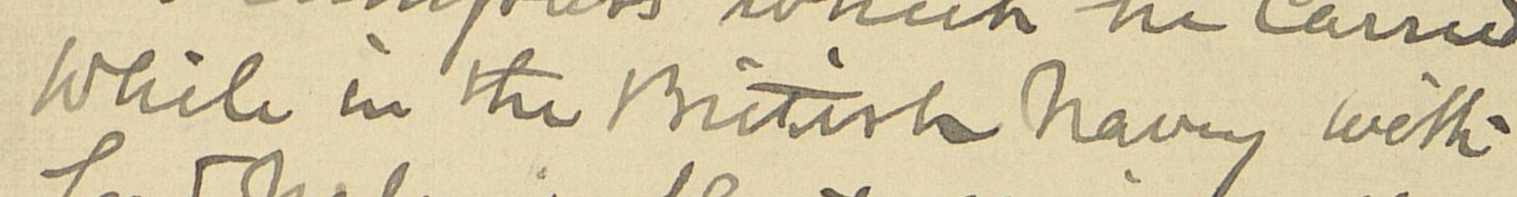While in the British Navy with
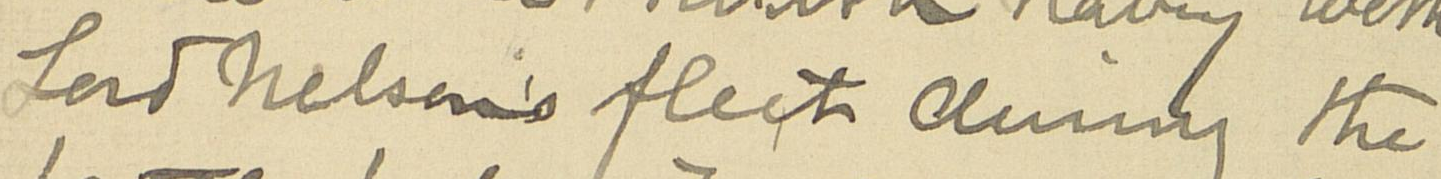Lord Nelson's fleet during the
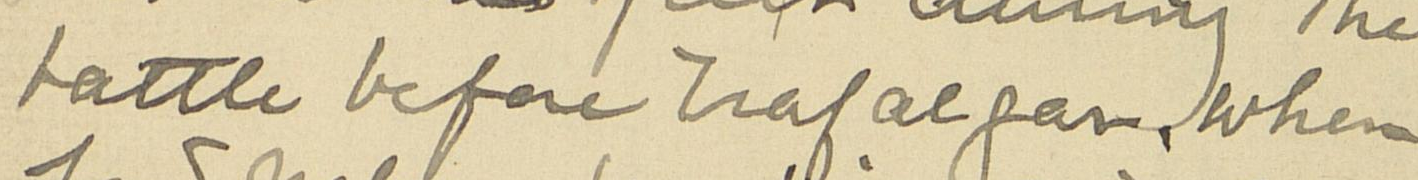battle before Trafalgar, when
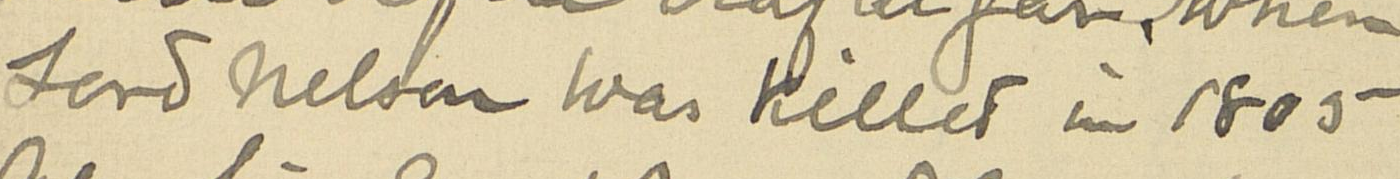Lord Nelson was killed in 1805
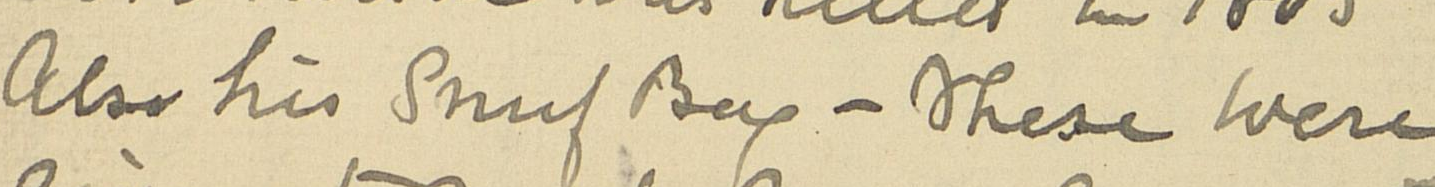Also his Snuf Box- These were
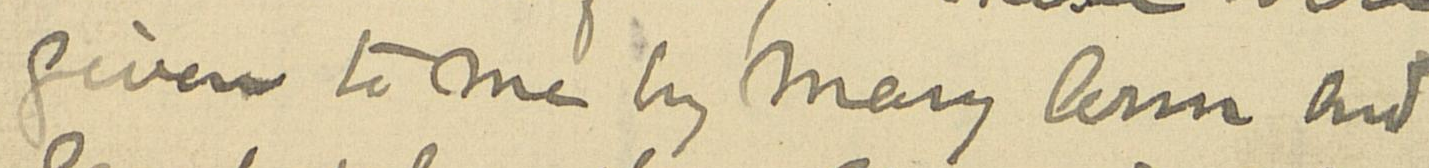given to me by Mary Ann and
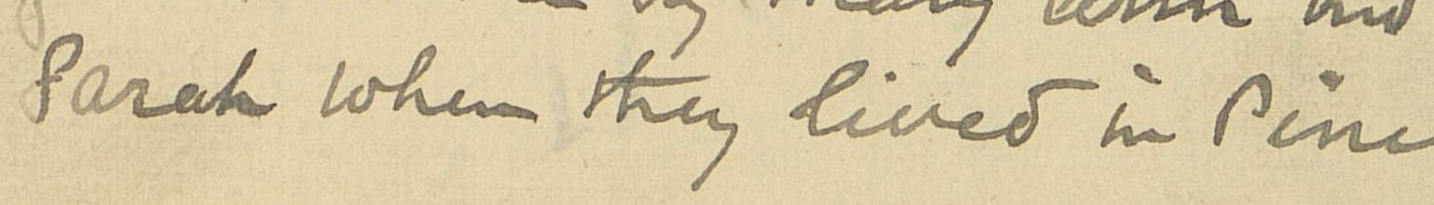Sarah when they lived in Pine
